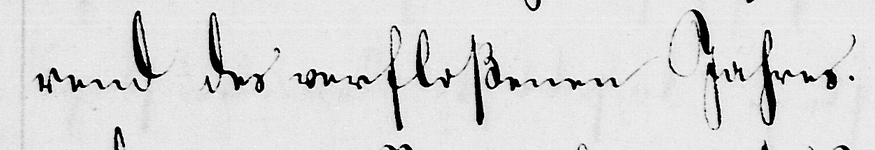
rend des verfloßenen Jahres.
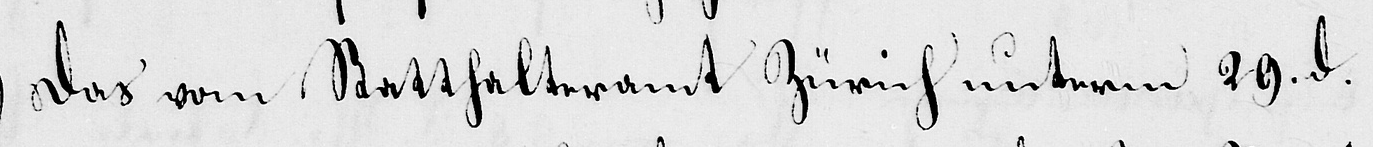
Das vom Statthalteramt Zürich unterm 29. d.
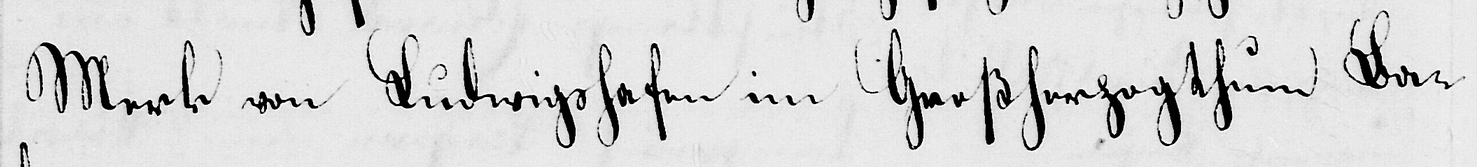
Merk von Ludwigshafen im Großherzogthum Ba¬
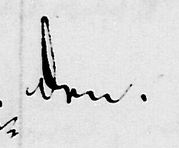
den.
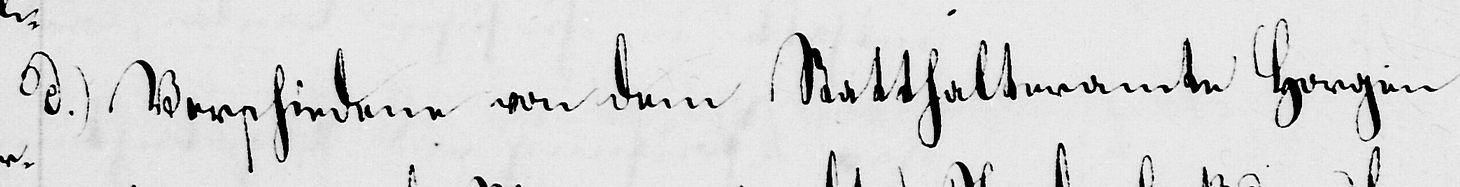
d.) Verschiedene von dem Statthalteramte Horgen
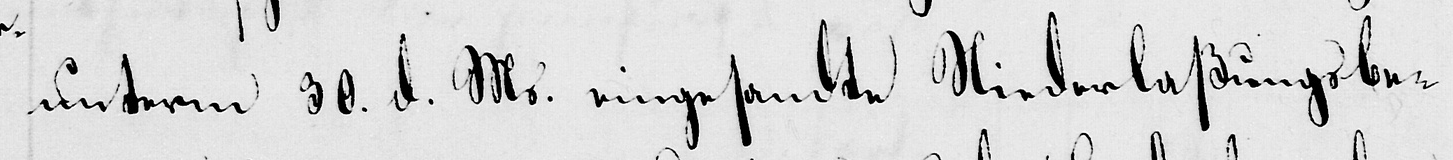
unterm 30. d. Ms. eingesandte Niederlaßungsbe¬
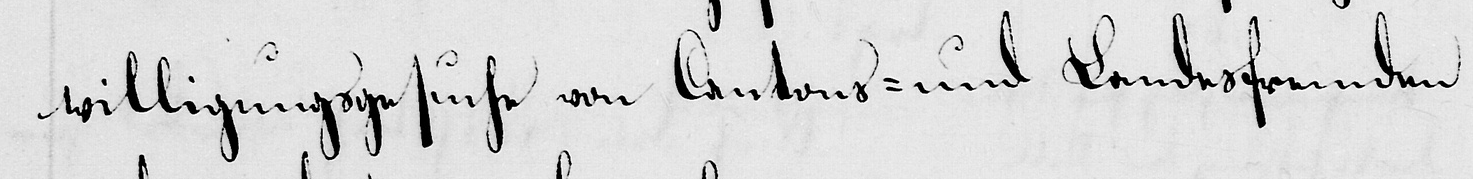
willigungsgesuche von Cantons- und Landesfremden
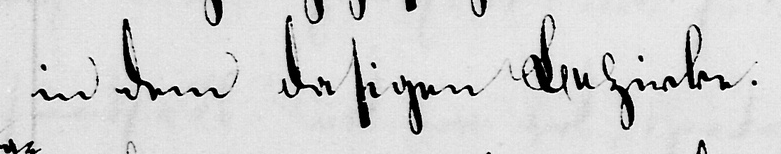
in dem dasigen Bezirke.
